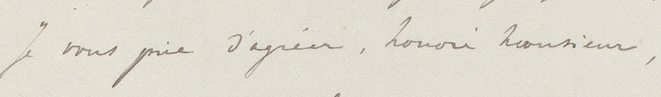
Je vous prie d'agréer, honoré Monsieur,
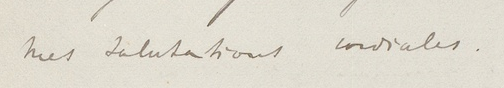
mes salutations cordiales.
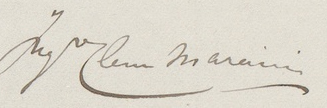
Ingre Clem Maraini
